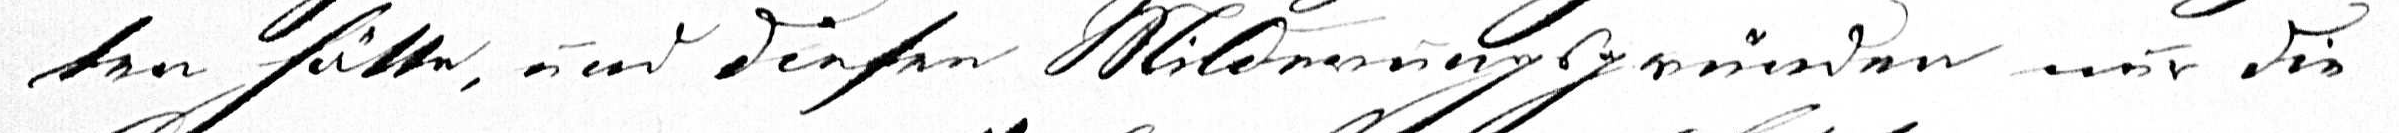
ten hätte, und diesen Milderungsgründen war die
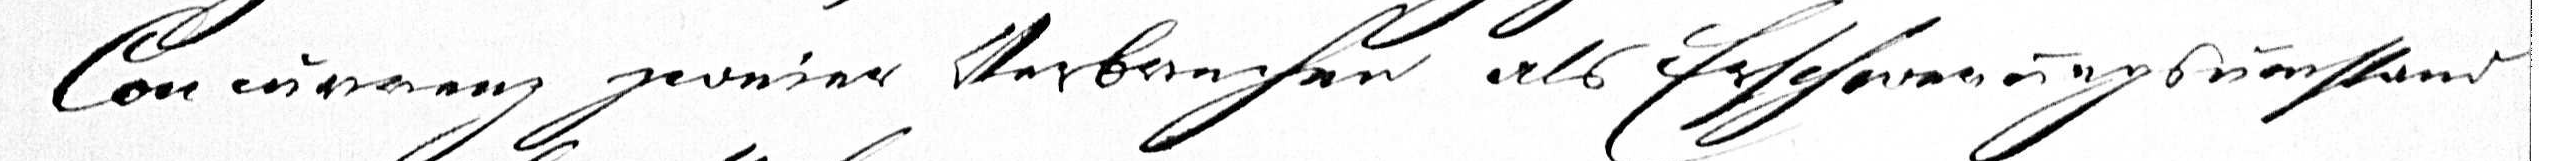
Concurrenz zweier Verbrechen als Erschwerungsumstand
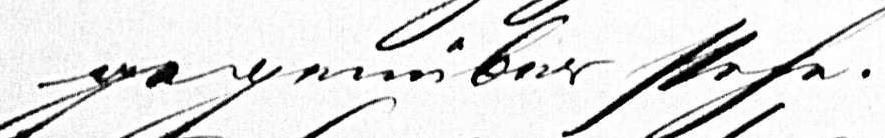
gegenüber stehe.
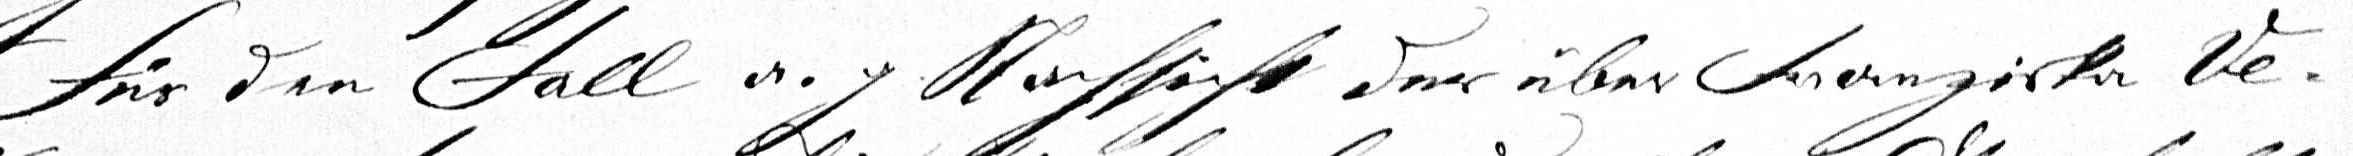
Für den Fall a.g. Nachsicht der über Franziska Ve¬
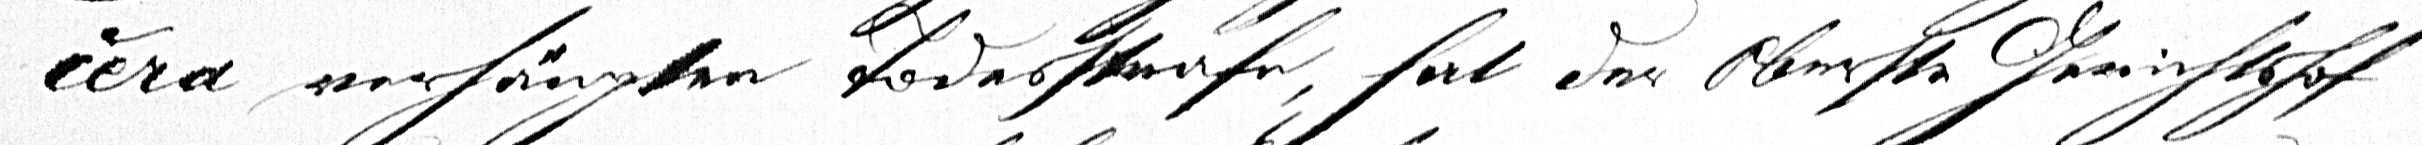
čera verhängte Todesstrafe, hat der Oberste Gerichtshof
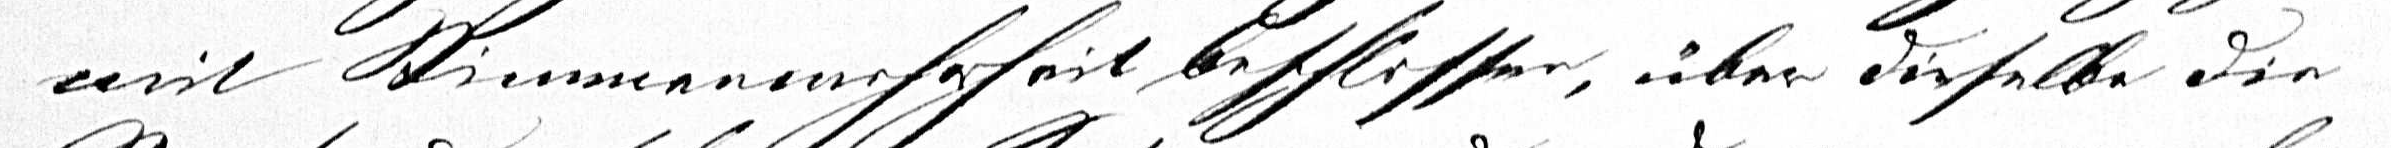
mit Stimmungsmehrheit beschlossen, über dieselbe die
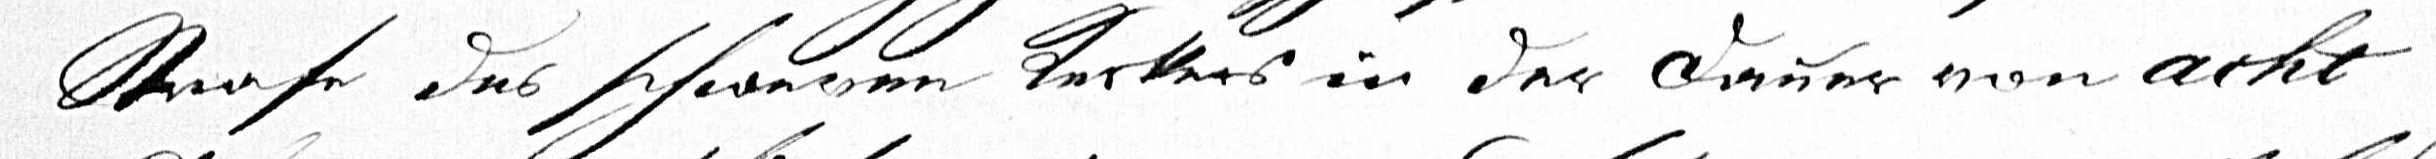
Strafe des Schweren Kerkers in der Dauer von acht
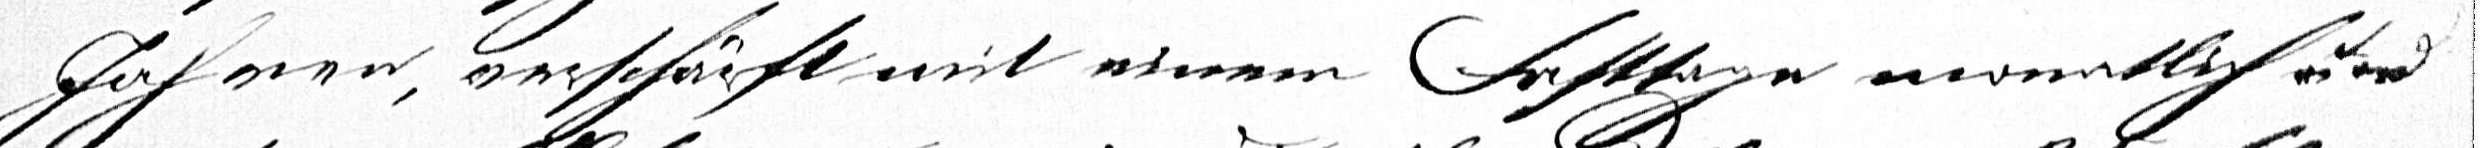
Jahren, verschärft mit einem Fasttage monatlich und
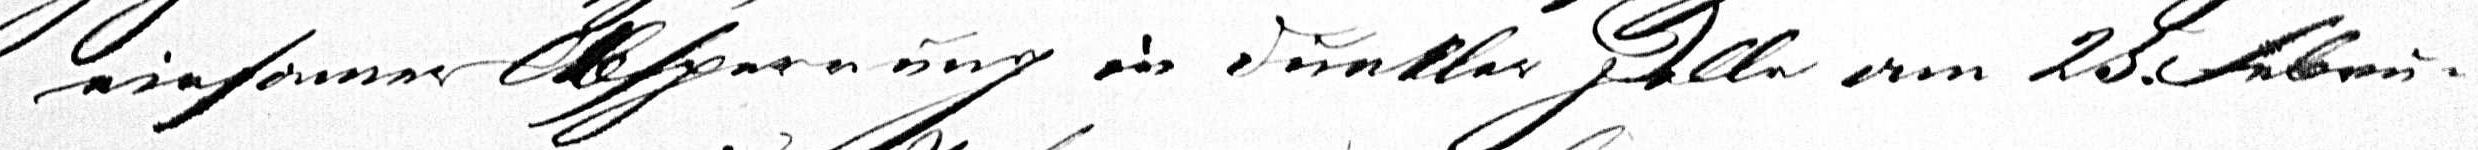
einsamer Besperrung in dunkler Zelle am 25. Febru¬
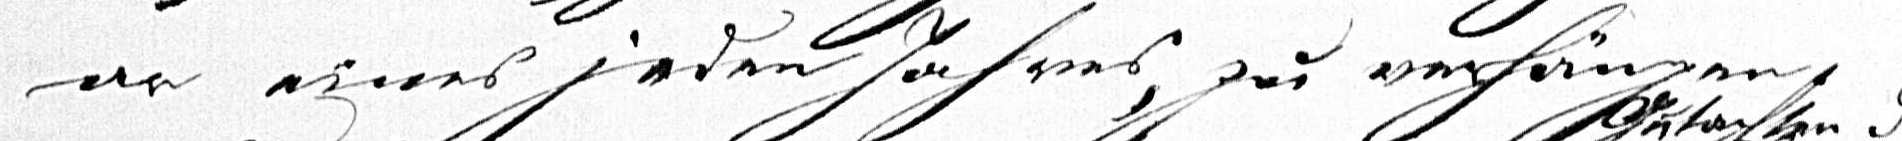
ar ines jeden Jahres zu erhängen.
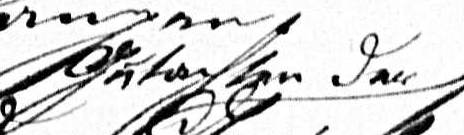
Gutachten der
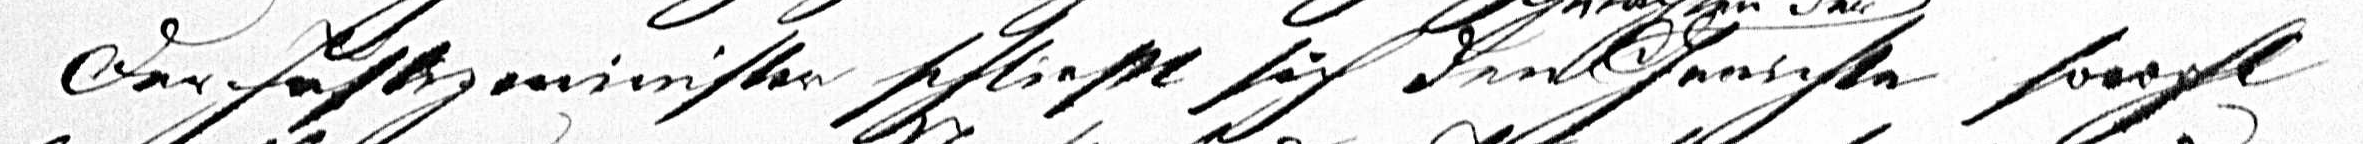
Der Justizminister schließt sich den Gerichte sowohl
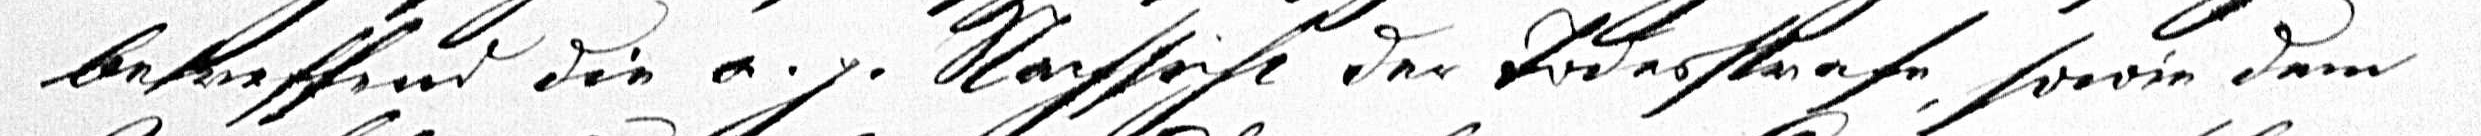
betreffend die a.g. Nachischt er Todesstrafe, sowie dem
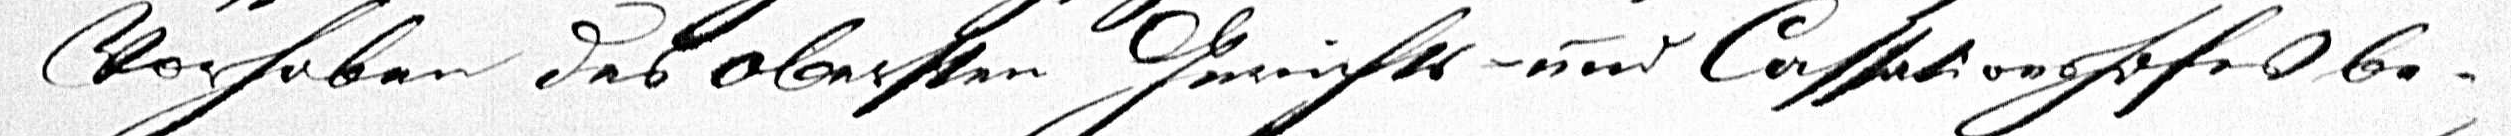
Vorhaben des obersten Gericht und Cassationshofes
